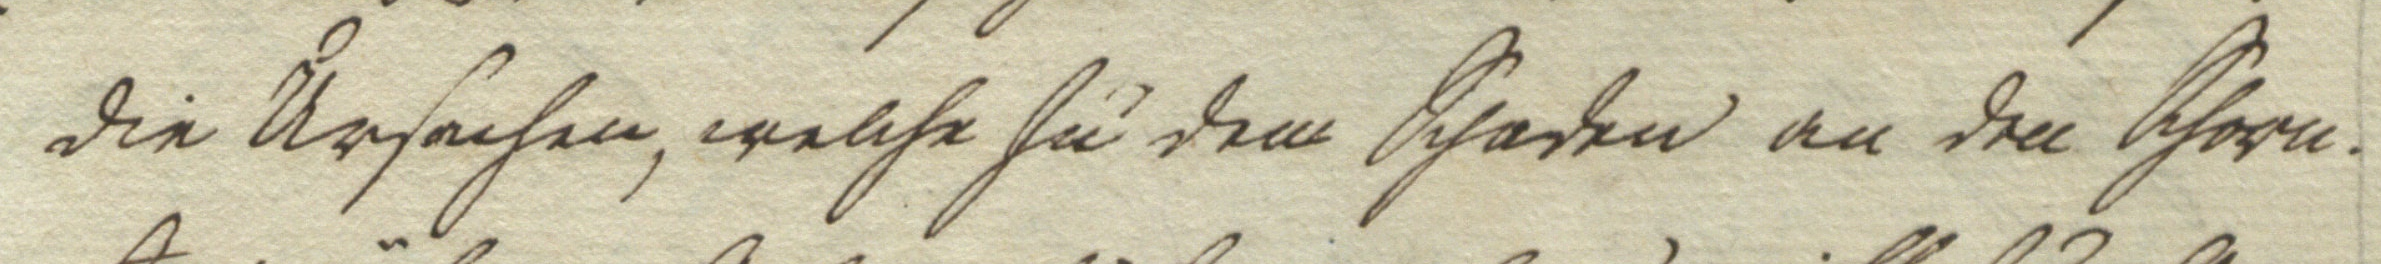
die Ursachen, welche zu dem Schaden an den Schorn¬
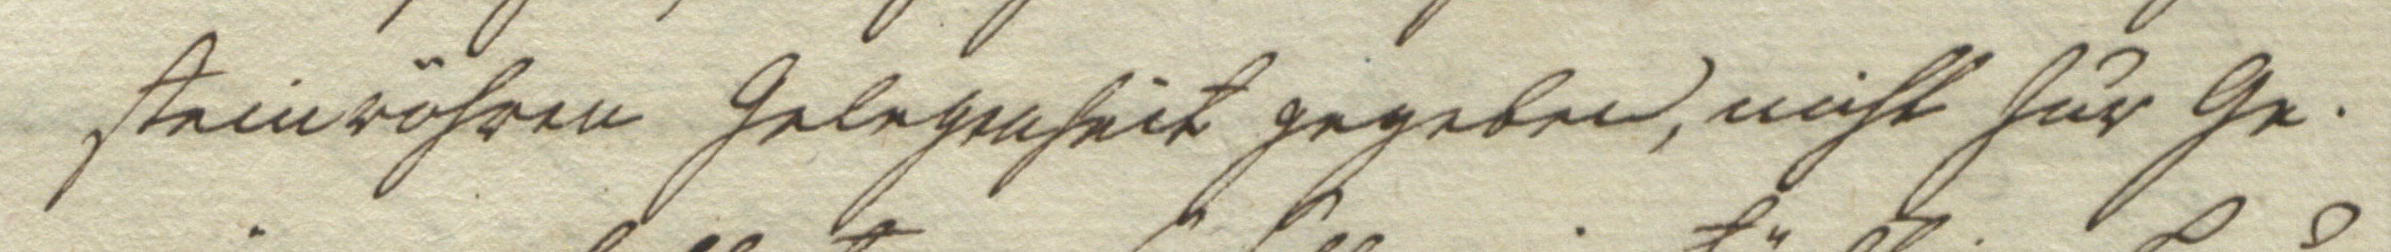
steinröhren Gelegenheit gegeben, nicht zur Ge¬
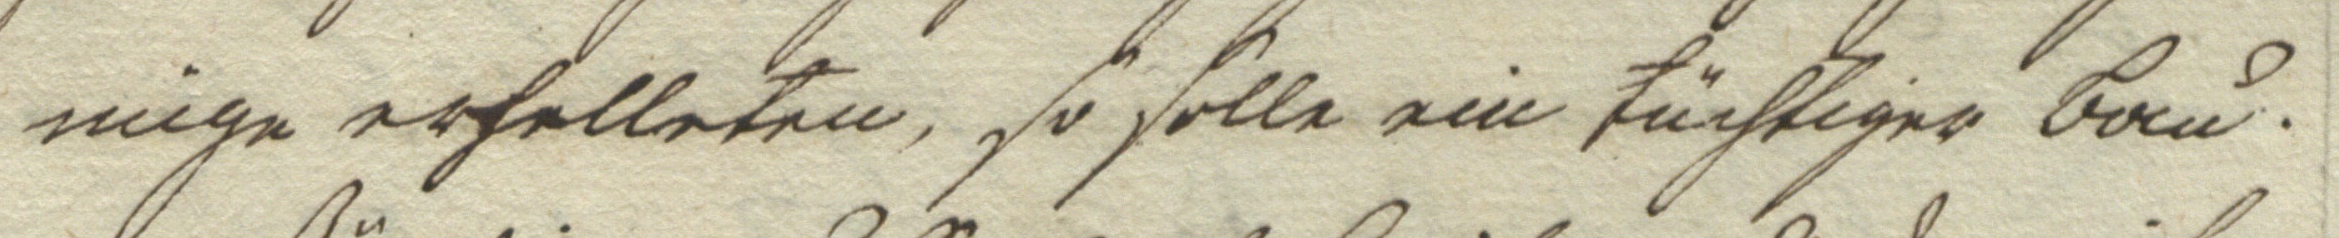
nüge erhelleten, so solle ein tüchtiger Bau¬
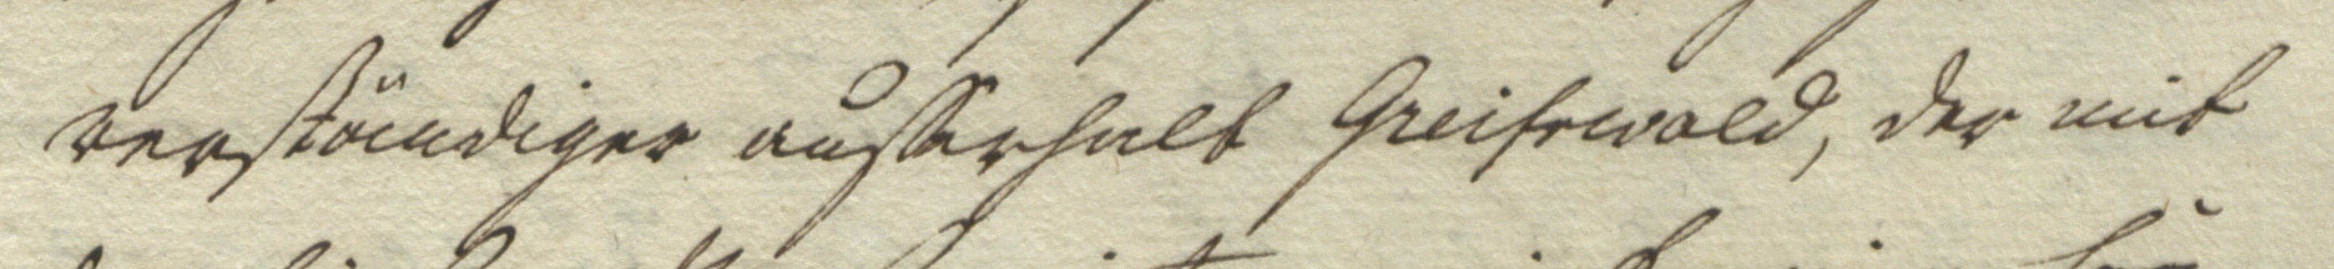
verständiger ausserhalb Greifswald, der mit
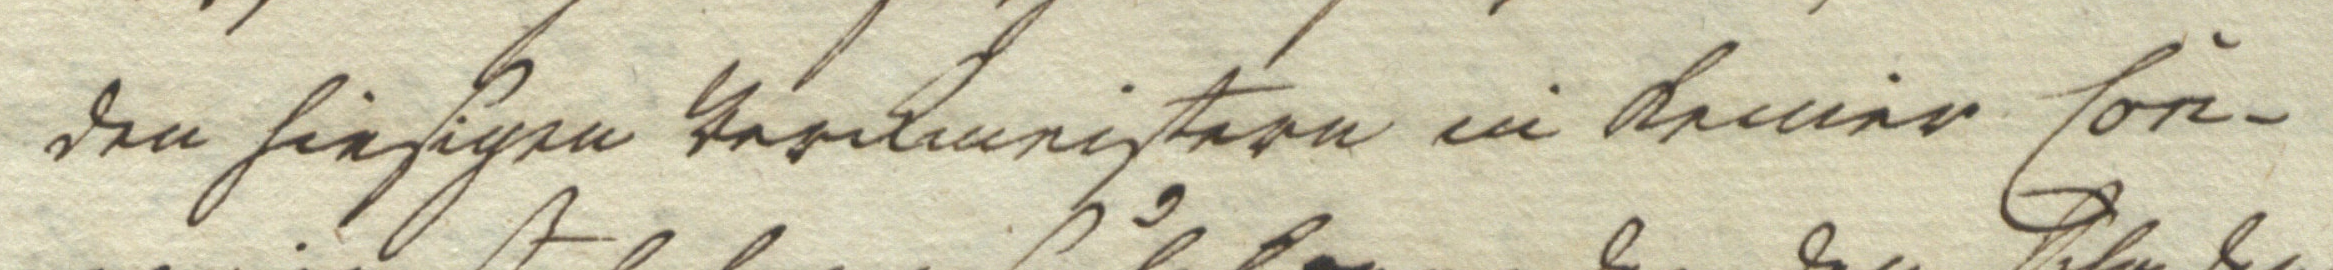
den hiesigen Werckmeistern in keiner Con¬
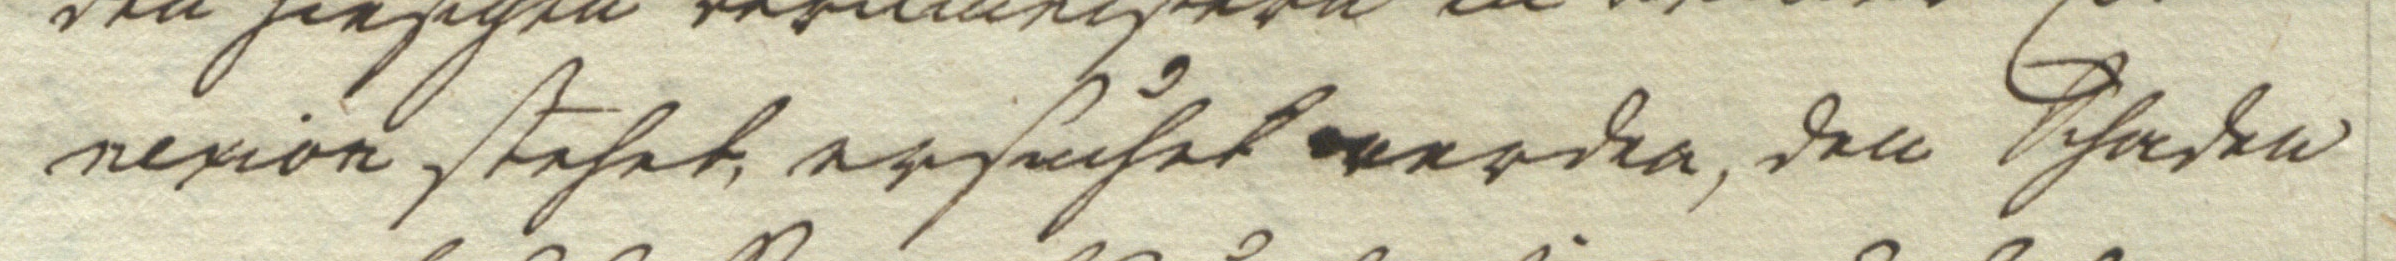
nexion stehet, ersuchet werden, den Schaden
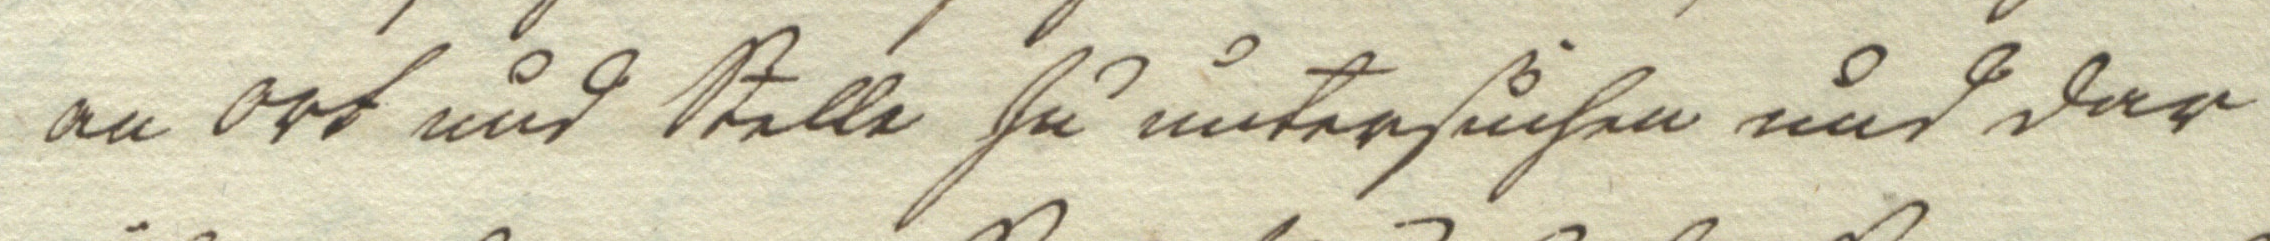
an Ort und Stelle zu untersuchen und dar¬
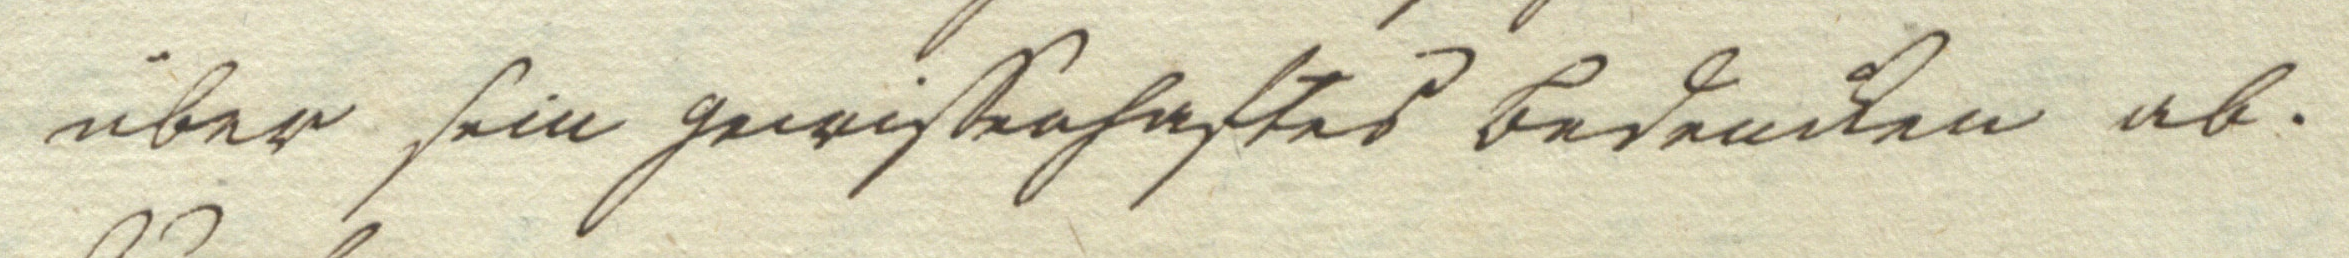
über sein gewissenhaftes Bedencken ab¬
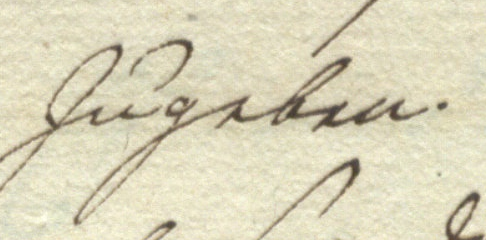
zugeben.
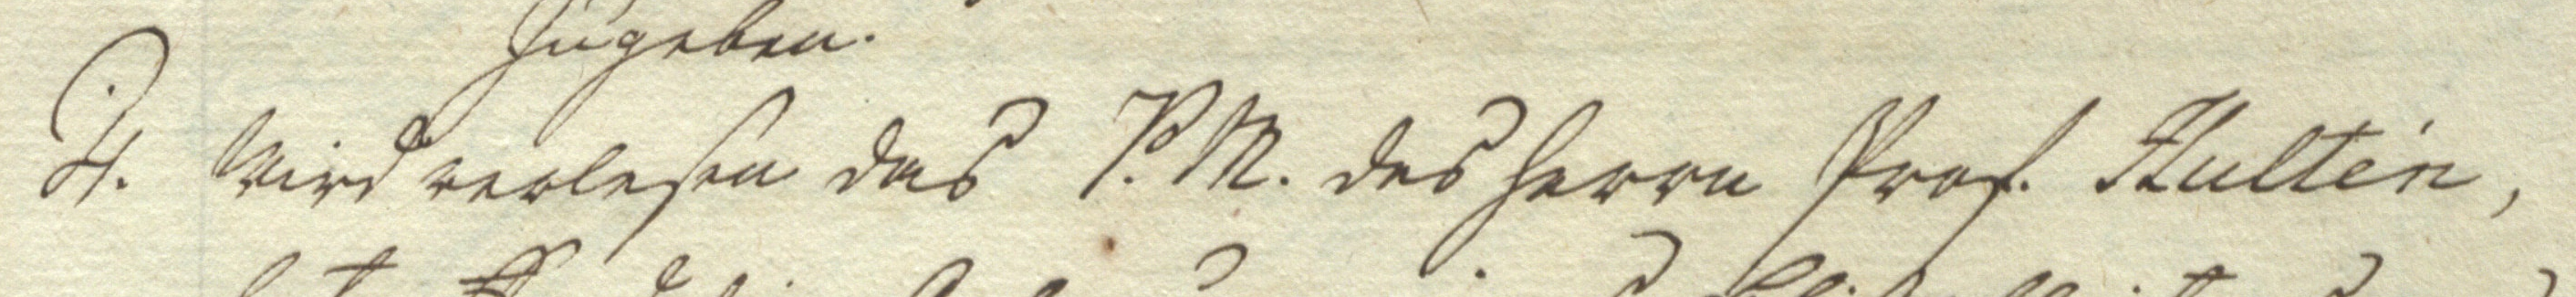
4. Wird verlesen das P. M. des Herrn Prof. Hultén,
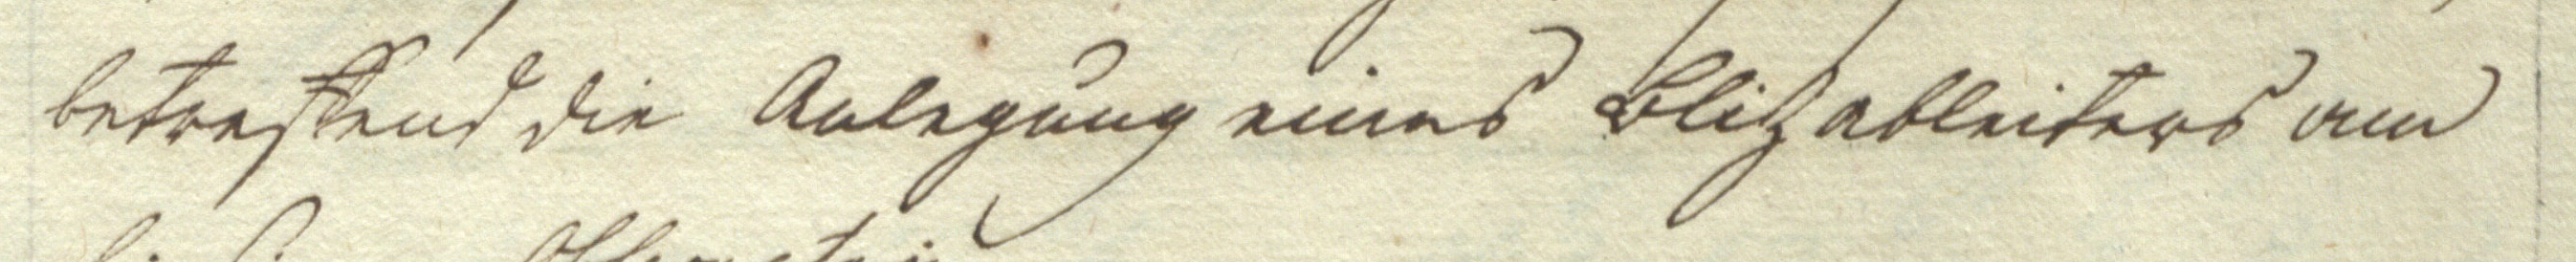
betreffend die Anlegung eines Blizableiters am
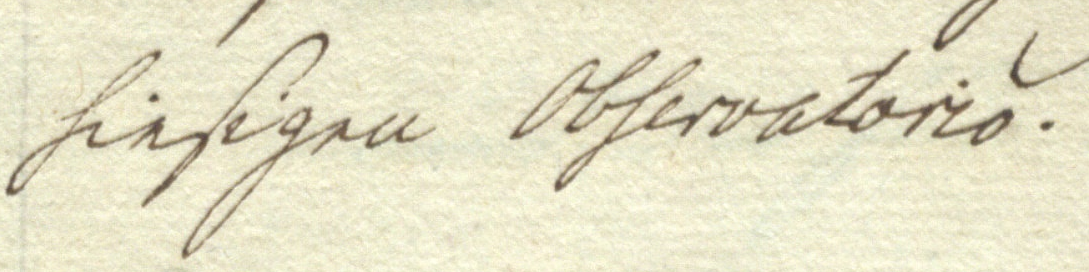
hiesigen Observatorio.
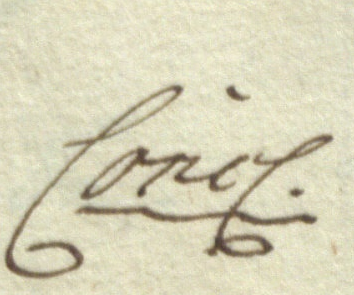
Concl.
